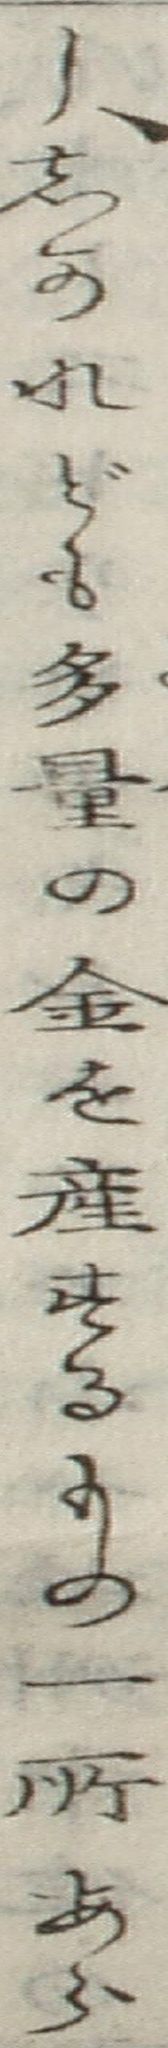し、しかれども多量の金を産するもの一所あら

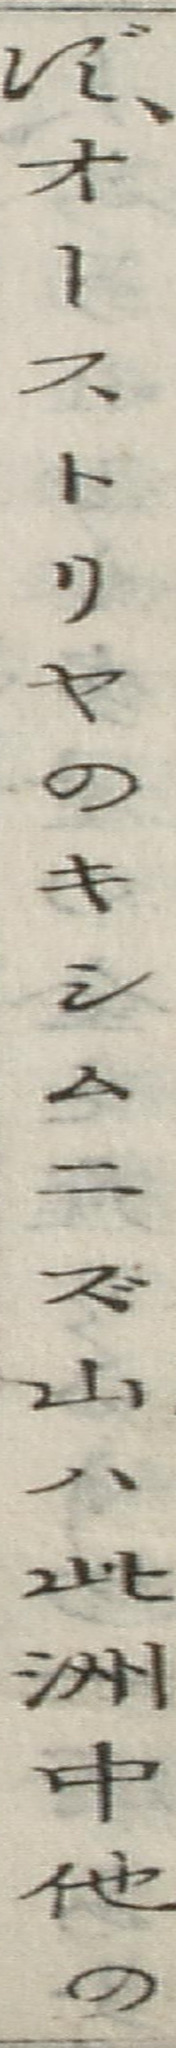ず、オーストリヤのキシムニズ山は此洲中他の
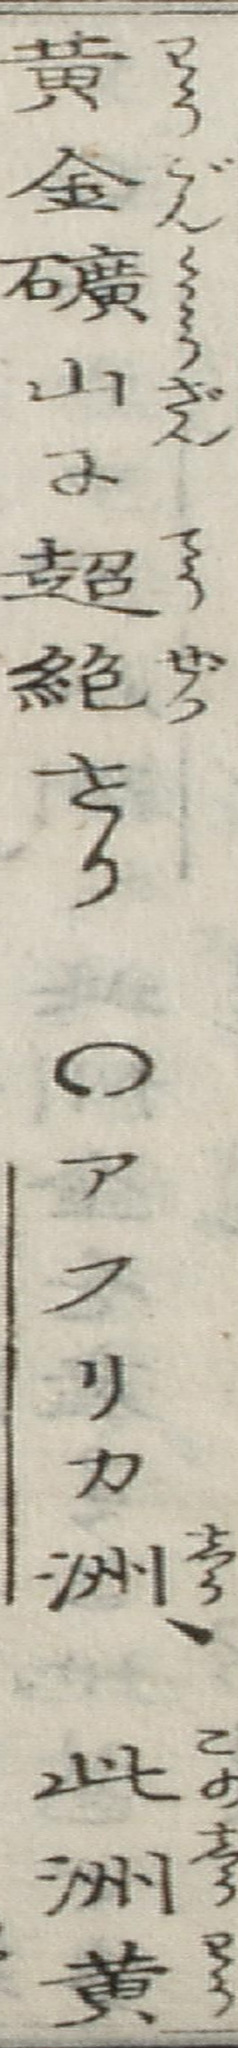黄金鉱山に超絶せり〇アフリカ洲、此洲黄
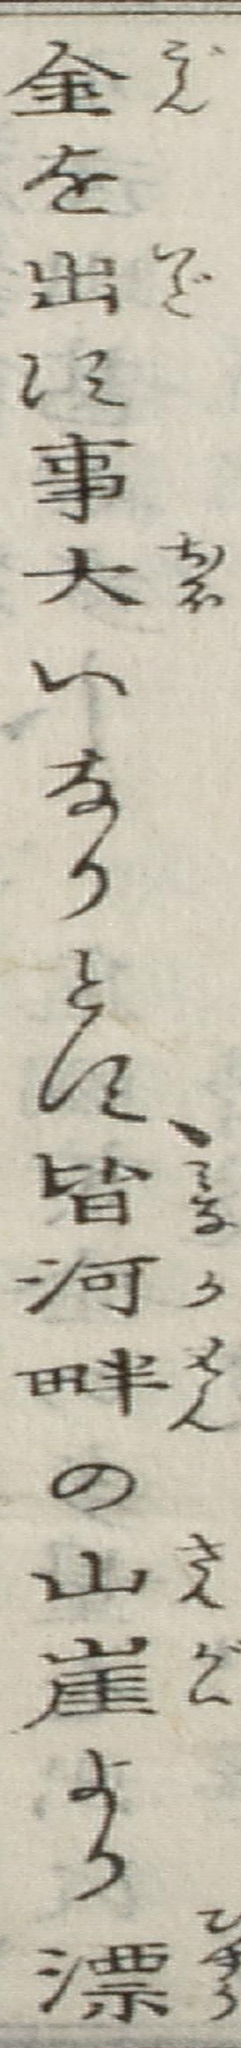金を出す事大いなりとす、皆河畔の山崖より漂
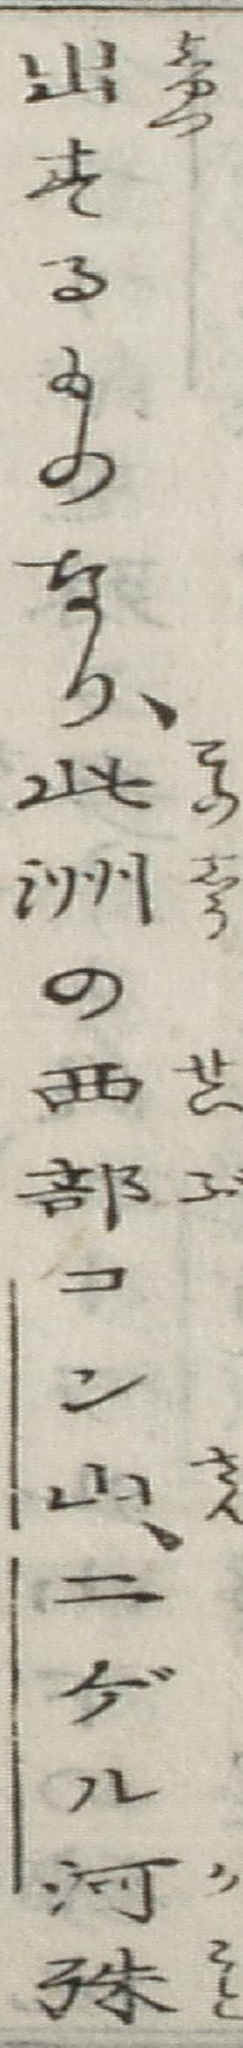出するものなり、此洲の西部コン山、ニゲル河殊
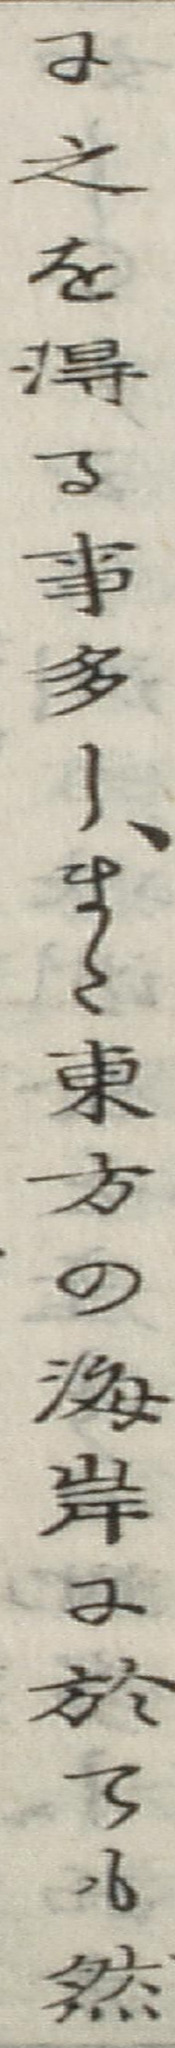に之を得る事多し、また東方の海岸に於ても然
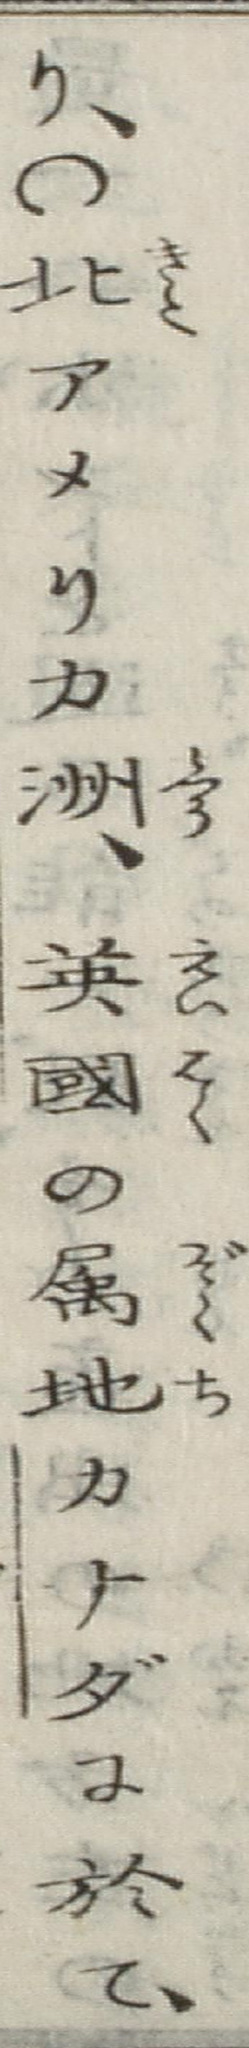り、〇北アメリカ州、英国の属地カナダに於て、
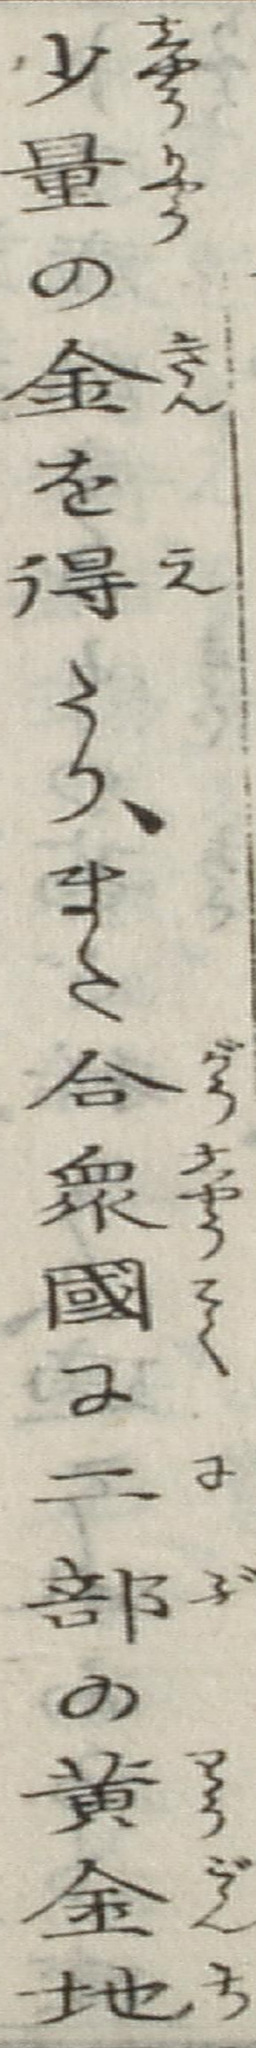少量の金を得たり、また合衆国に二部の黄金地
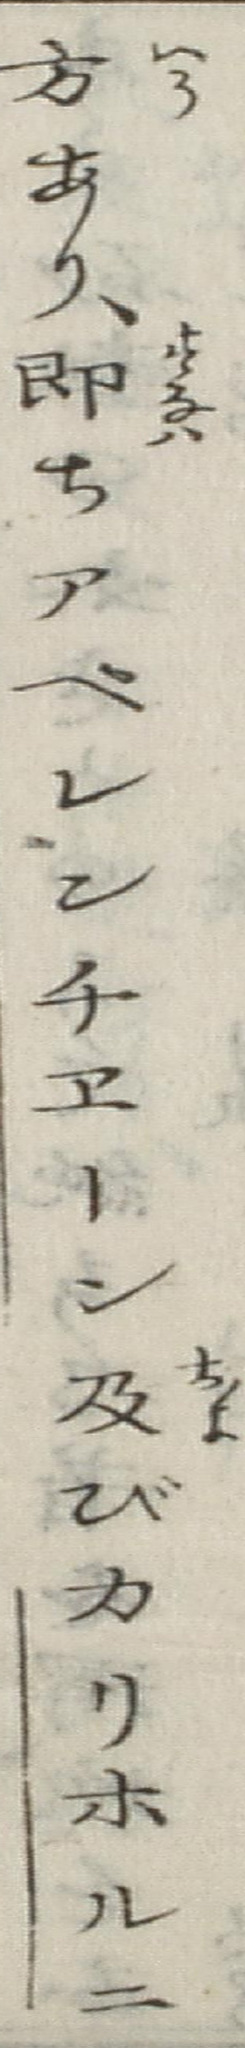方あり、即ちアペレンチエーン及びカリホルニ
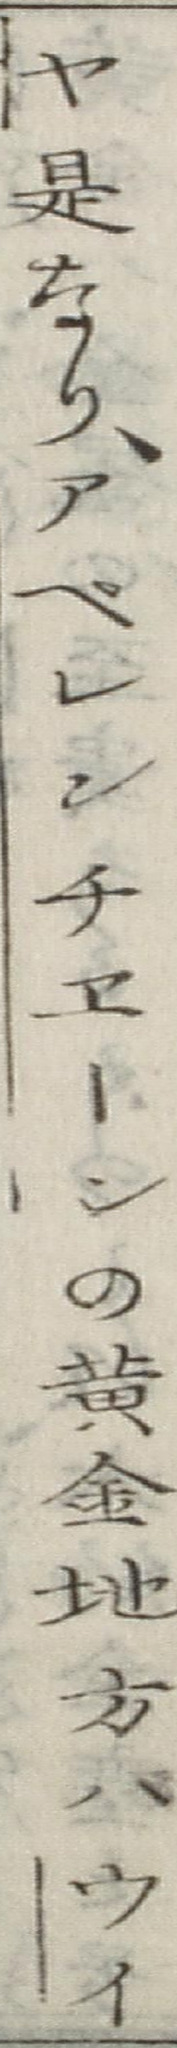ヤ是なり、アペレンチエーンの黄金地方はウイ
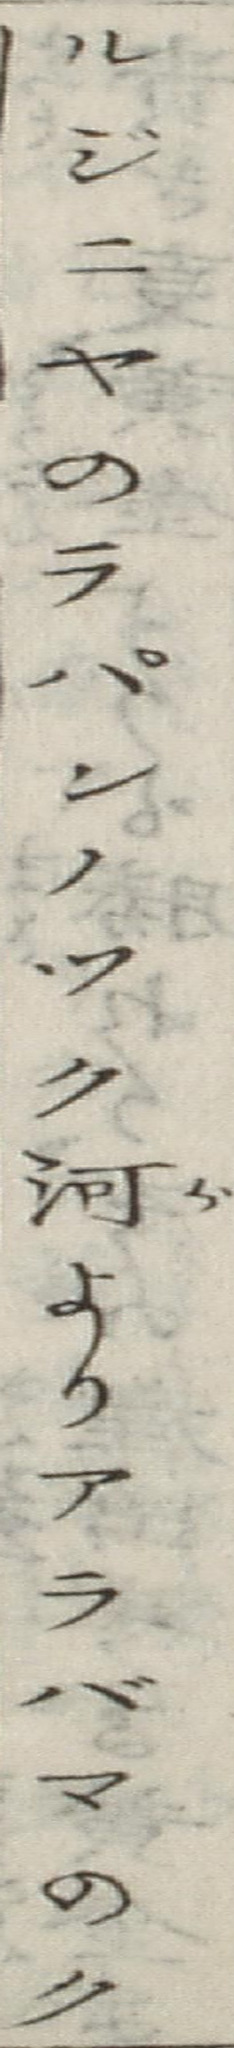ルジニヤのラパンノック河よりアラバマのク
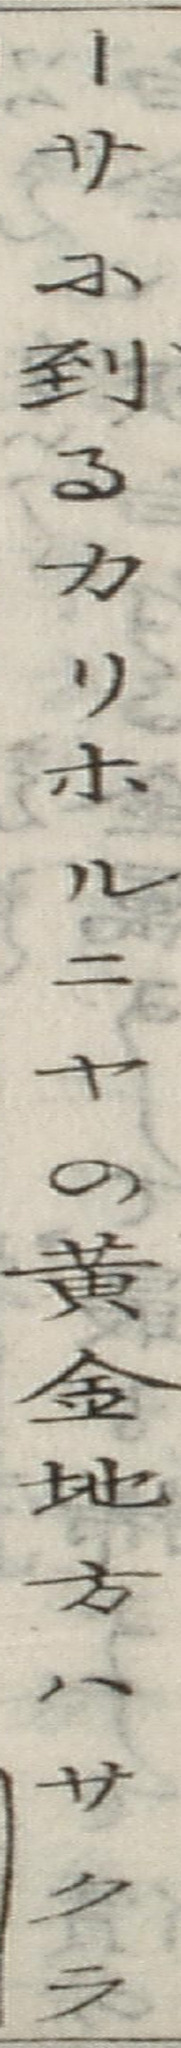ーサに到るカリホルニヤの黄金地方はサクラ
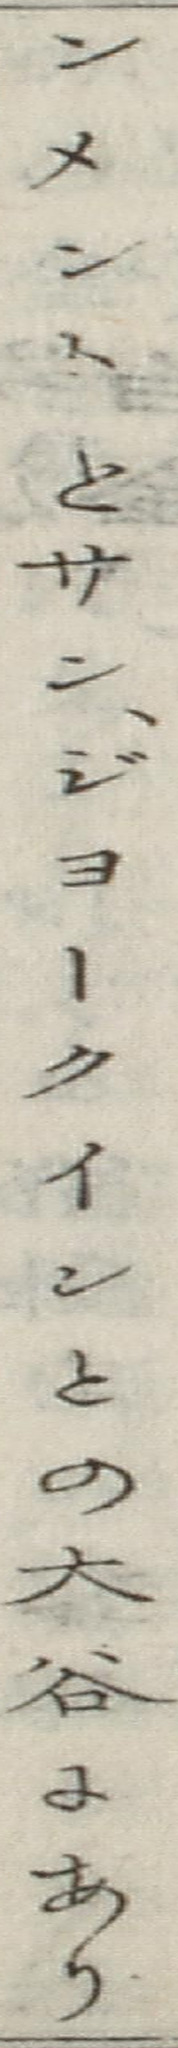ンメントとサン、ジョークインとの大谷にあり
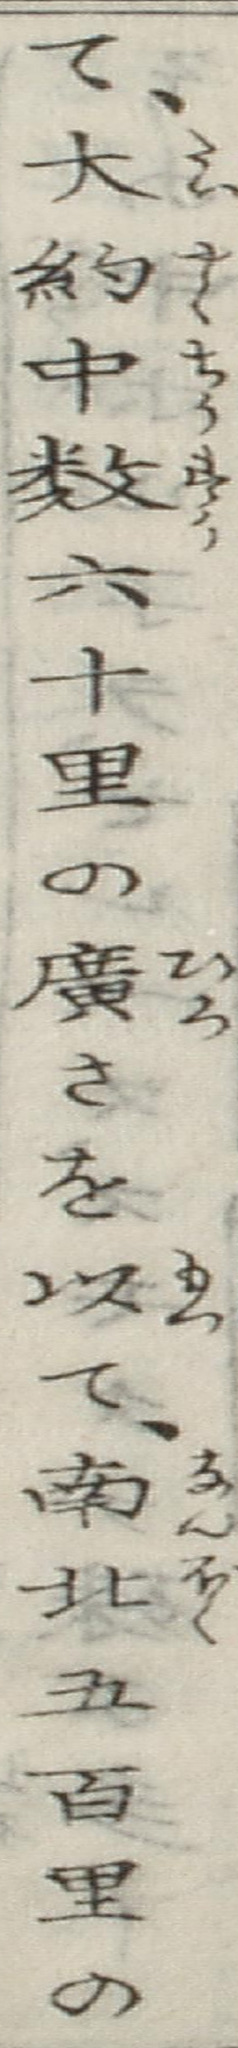て、大約中数六十里の広さを以て、南北五百里の
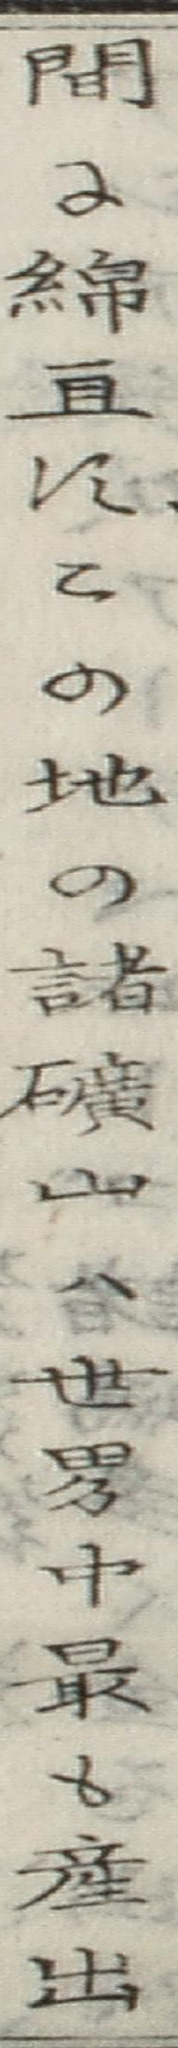間に綿旦す、この地の諸鉱山は世界中最も産出
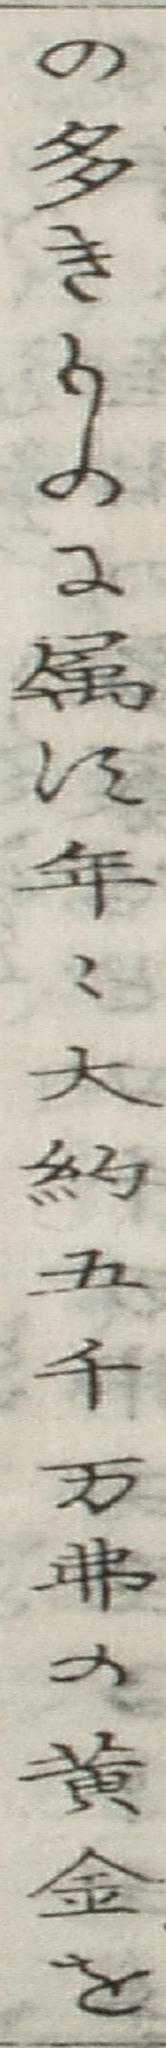の多きものに属す、年ゝ大約五千万弗の黄金を
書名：訓蒙　天然地理學　下
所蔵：東京大学地震研究所図書室 Earthquake Research Institute Library, The University of Tokyo, JAPAN
